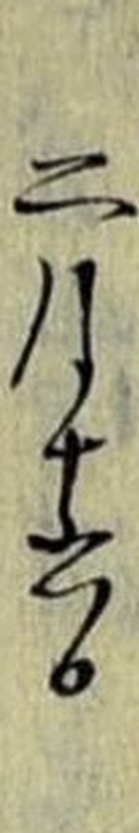二月十六日
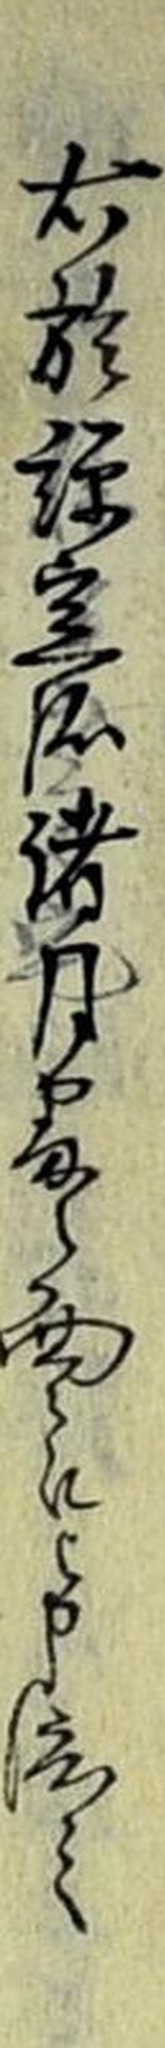右於評定所諸月番之面々江被申渡之
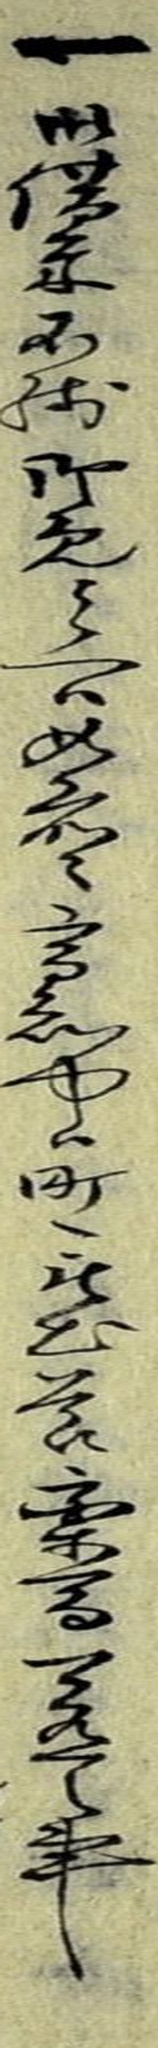一御借米不残御免ニ候ヘハ如前々高知中ハ町へ被出節乗馬可有之事
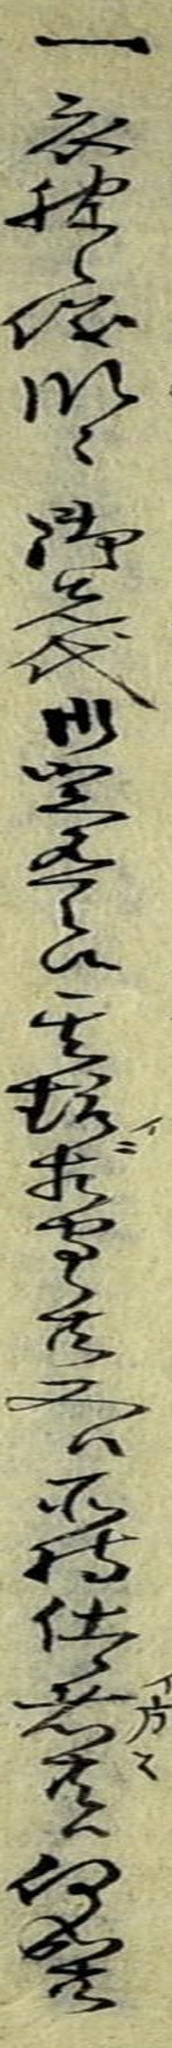一衣服之儀段々御先代御定有之候其趣相守候共又ハ所持仕候者共方々ハ何成共
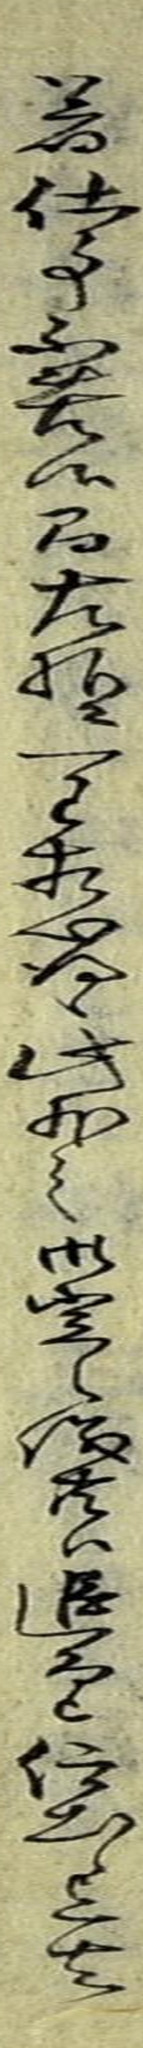着仕事不苦候間左様ニ可被相心得候此外之御定之儀共ハ追而被仰出候迄者
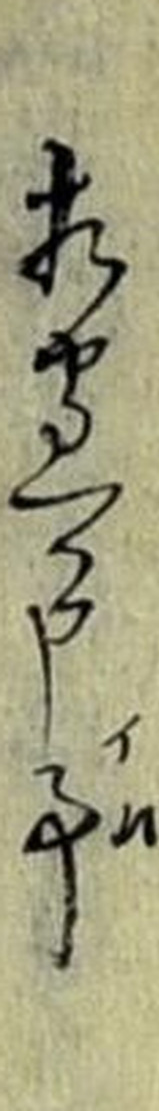相守可申事
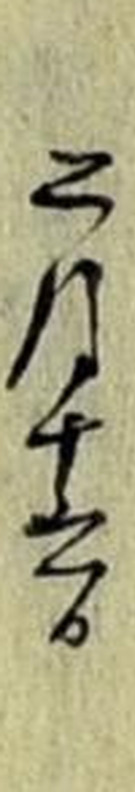二月十六日
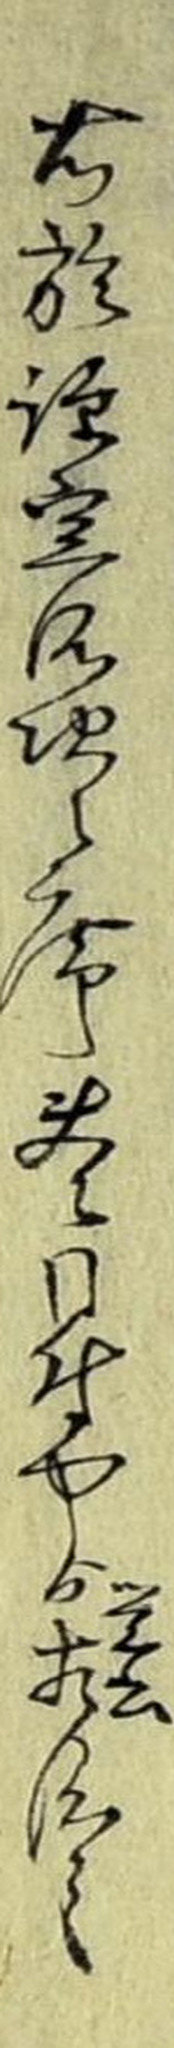右於評定所次之席夫々目付中ゟ覚書相渡之
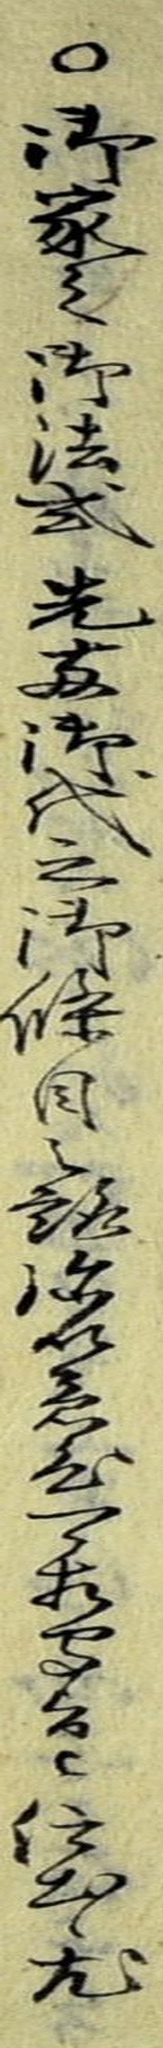〇御家之御法式先両御代之御条目之趣弥以急度可相守旨被仰出候尤

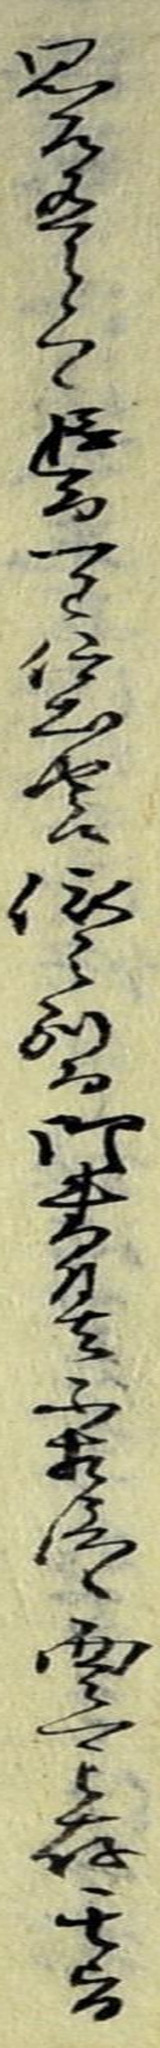思召有之候ハヽ追而可被仰出候由ニ候依之別而御書付者不相渡候面々可被存其旨
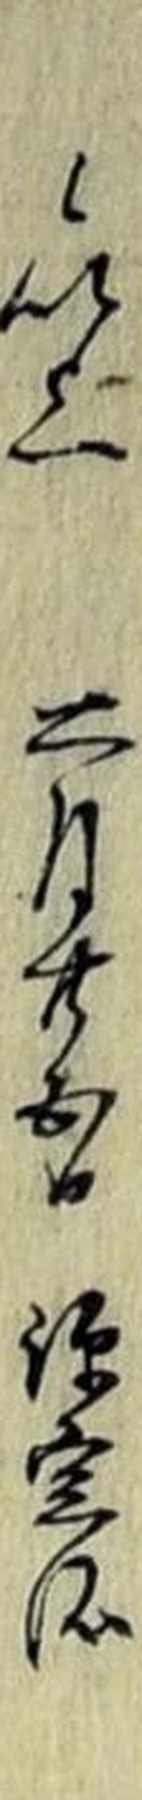候以上二月廿五日評定所
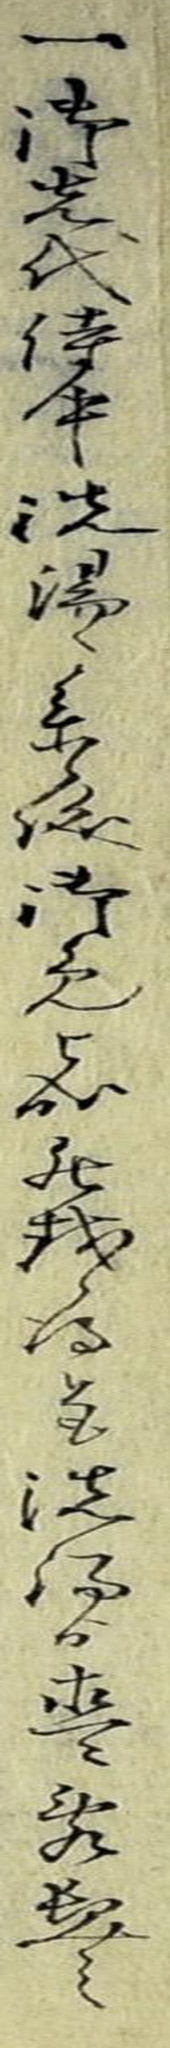一御先代侍中洗湯へ参候儀御免被成罷越候得とも洗湯ゟ直ニ乱髪之
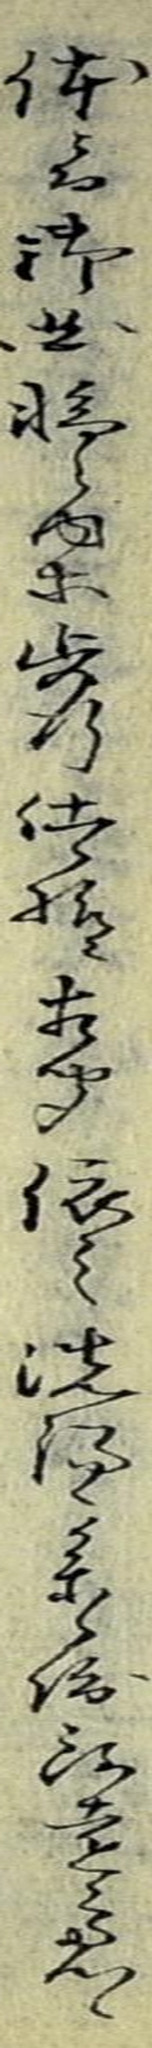体ニ而御曲輪之内等歩行仕候様ニ相聞依之洗湯へ参候儀致遠慮候
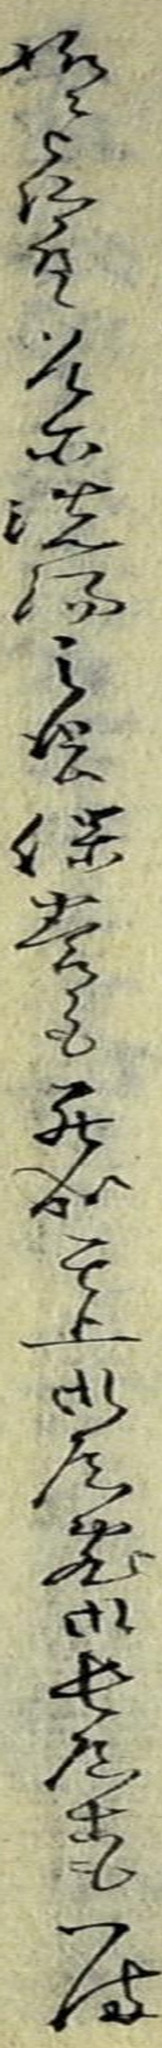様ニ被仰付候乍尓洗湯之儀ハ保養とも罷成其上御屋敷御長屋等もつま
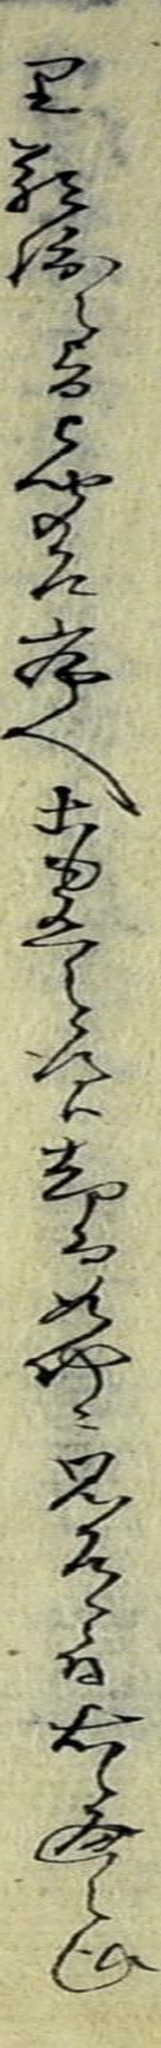り難儀之旨被聞召病人等も有之候得ハ却而如何ニ思召候ニ付右之通之趣
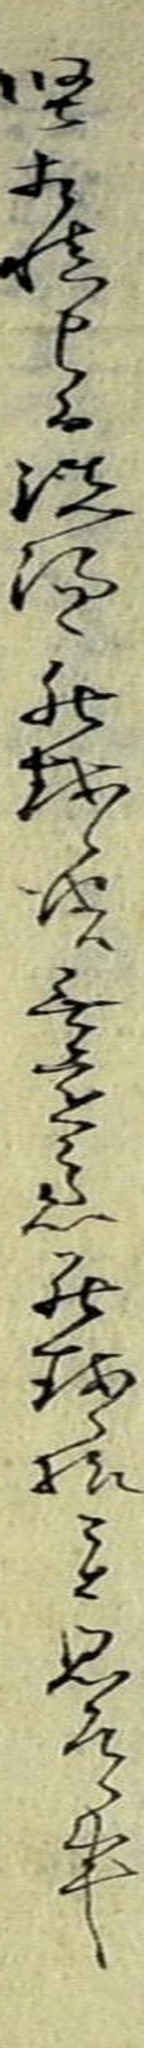堅相慎申候而洗湯へ罷越候儀ハ無遠慮罷越候様ニと思召候事
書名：命令之部 一
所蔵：福井県文書館 Fukui Prefectural Archives
